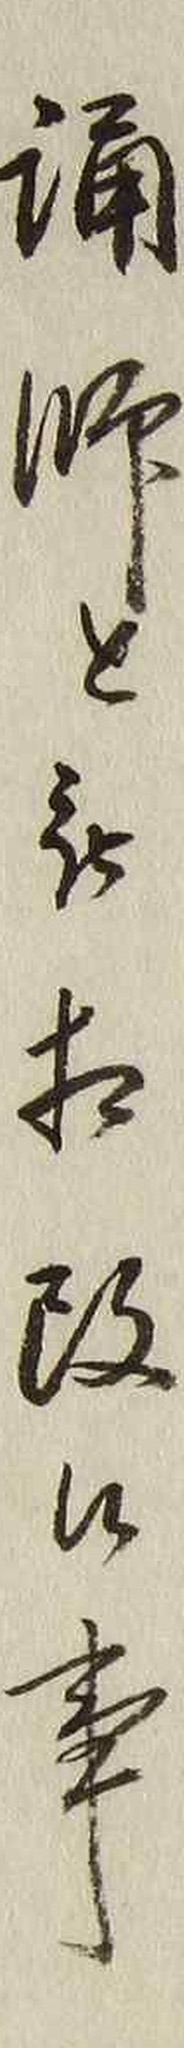誦師と被相改候事
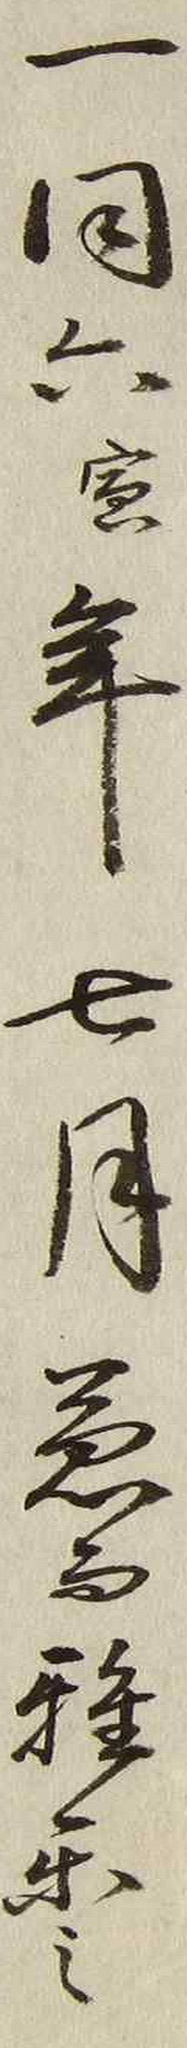一同六寅年七月兼而雅楽之
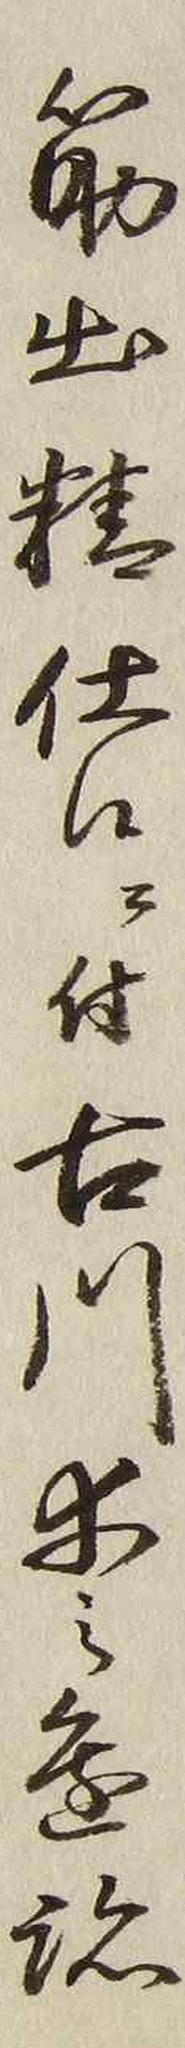筋出精仕候ニ付古川才之進跡
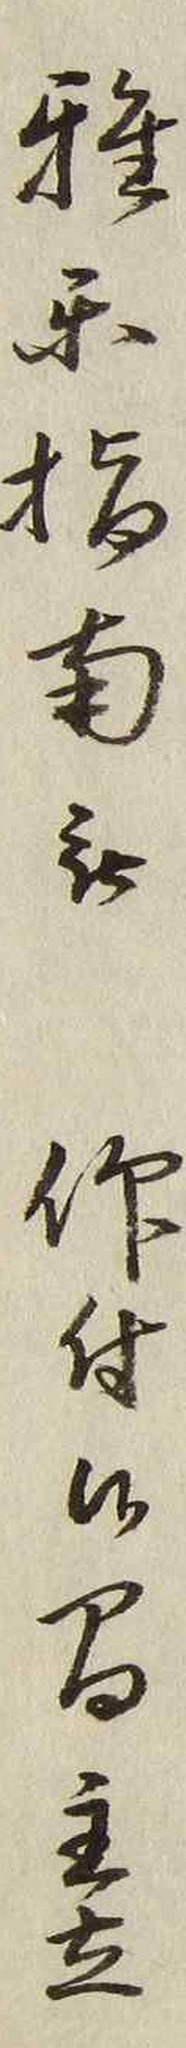雅楽指南被仰付候間主立

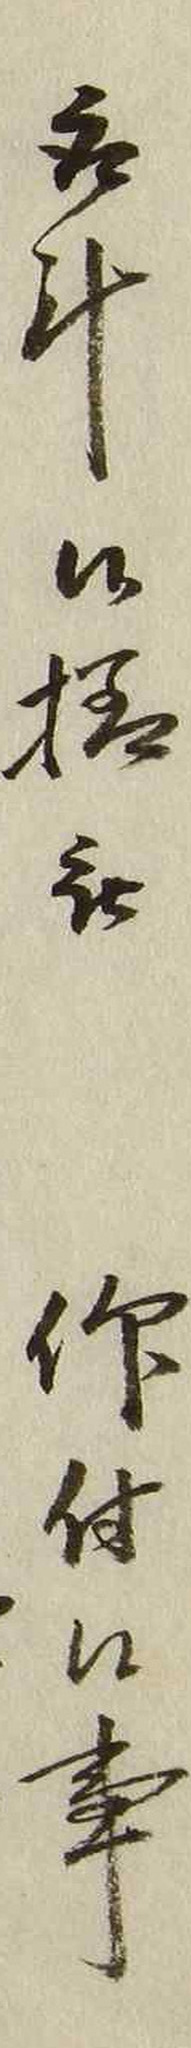取斗候様被仰付候事
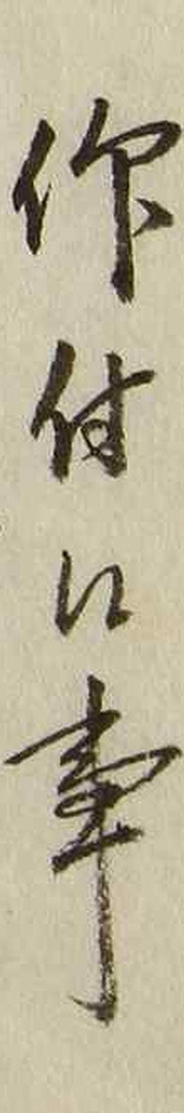仰付候事
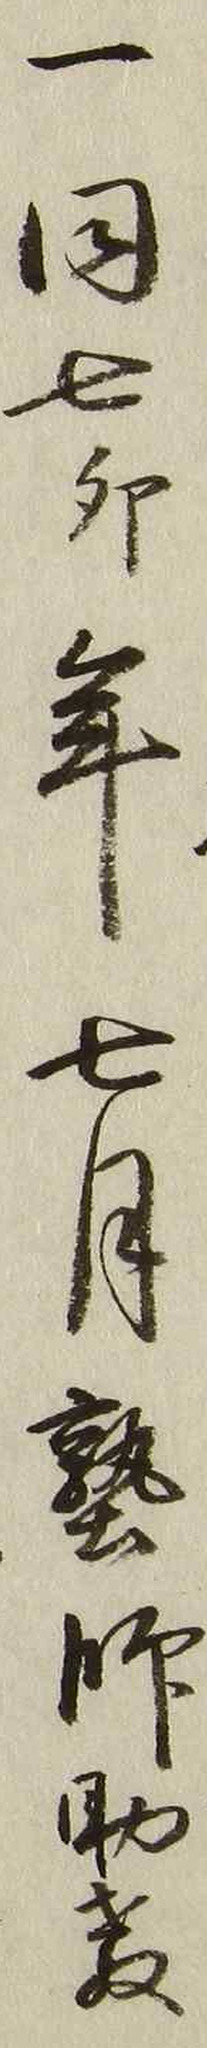一同七卯年七月塾師助教
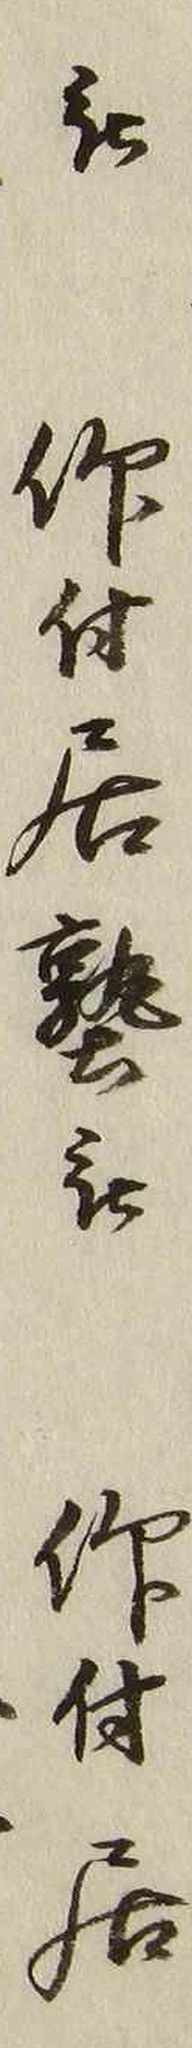被仰付居芸被仰付居
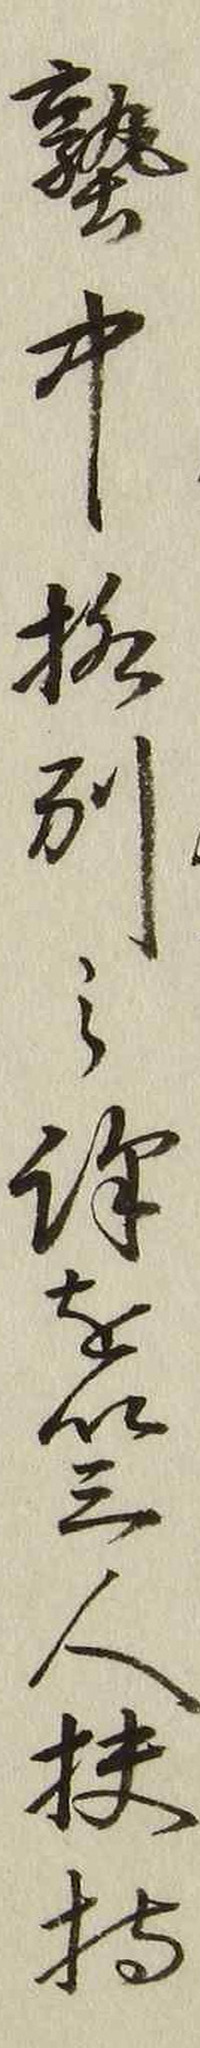芸中格別之訳を以三人扶持
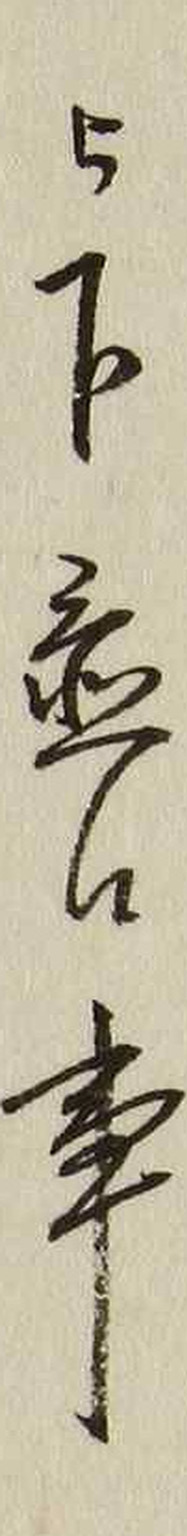被下置候事
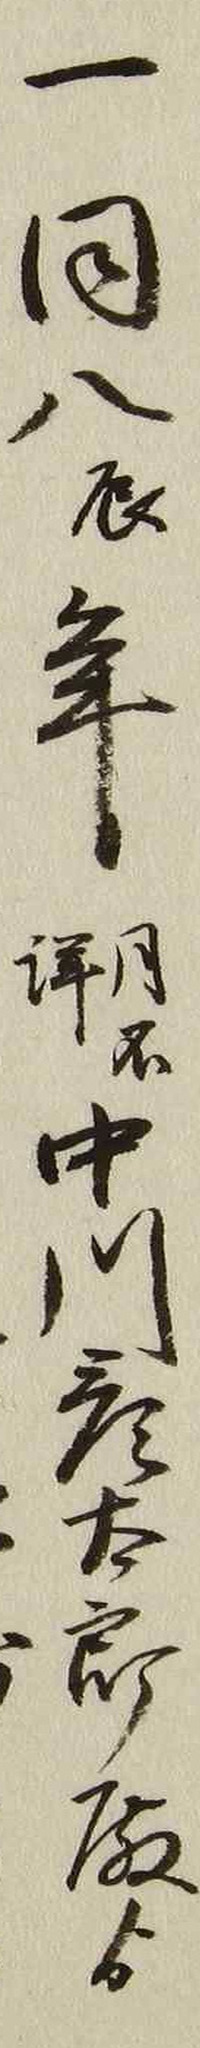一同八辰年月不詳中川彦太郎殿より
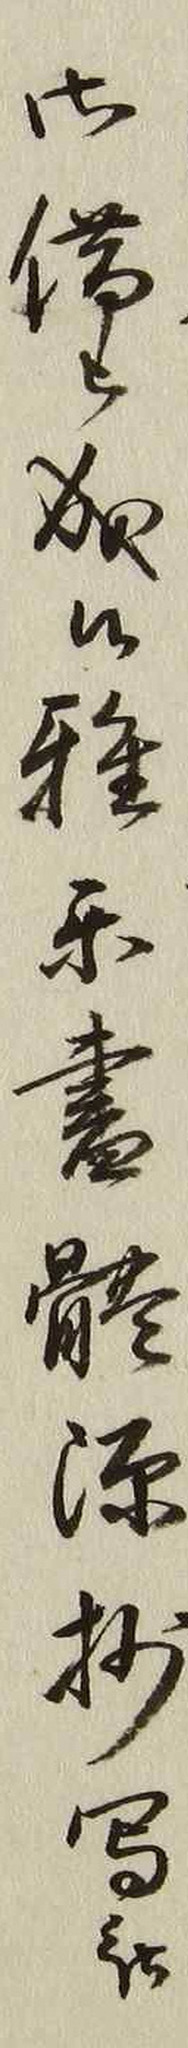御借被成候雅楽書体源抄写被
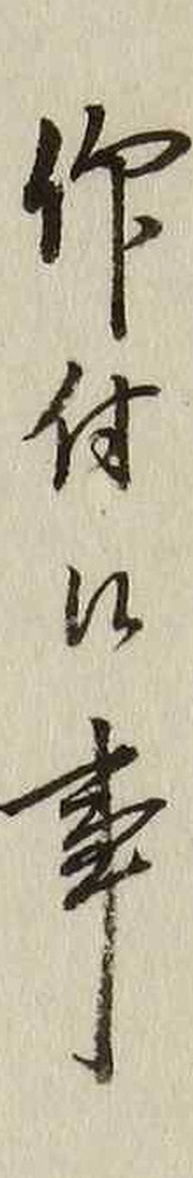仰付候事
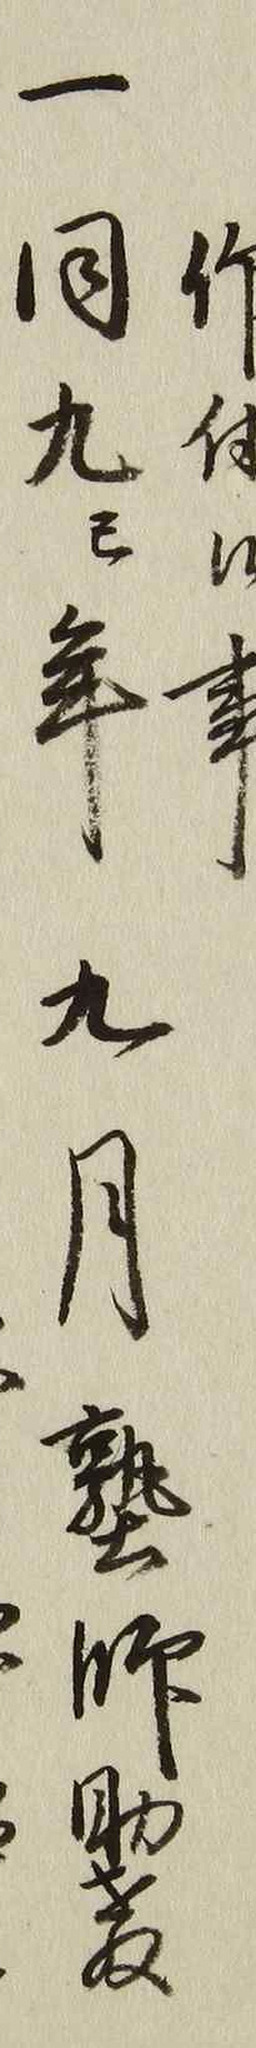一同九巳年九月塾師助教
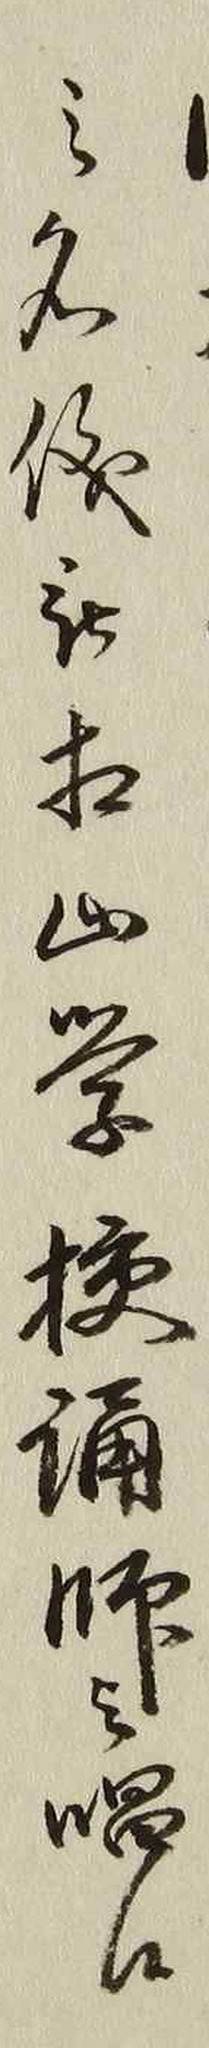之名儀被相止学校誦師与唱候
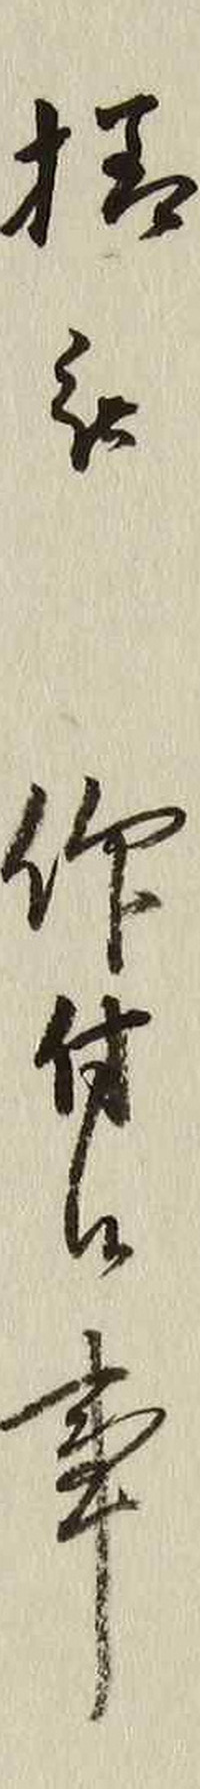様被仰付候事
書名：諸士系譜　巻之136　た之部12
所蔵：会津若松市立会津図書館
